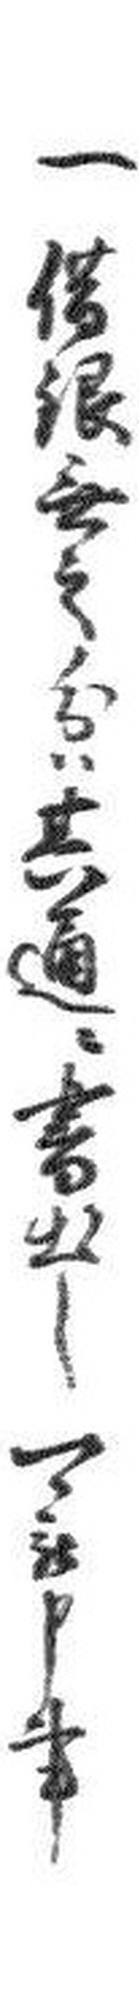一借銀無之分は其通に書出し可被申事
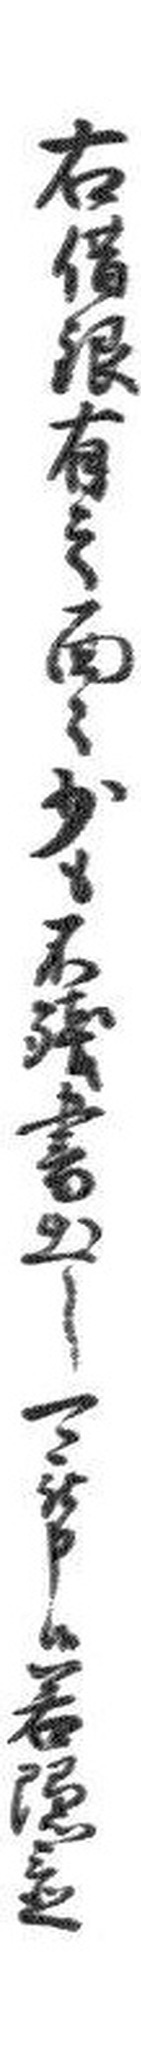右借銀有之面々少も不残書出し火可被申候若隠置
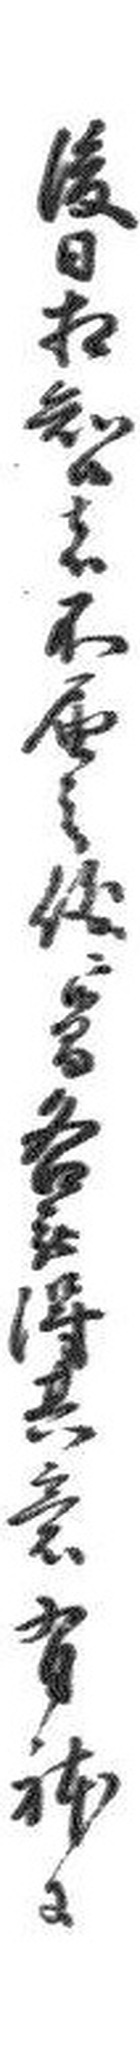後日相知候者不届之儀ニ候間各被得其意有躰に
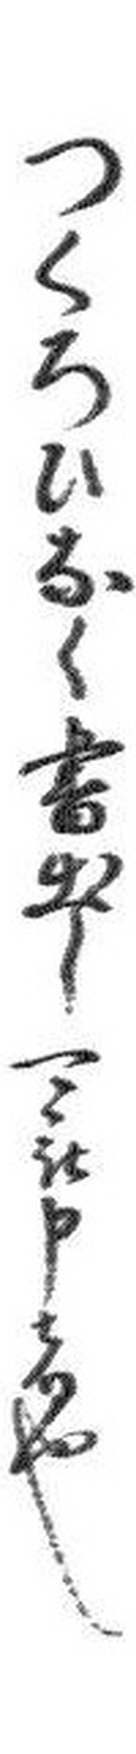つくろひなく書出し可被申者也
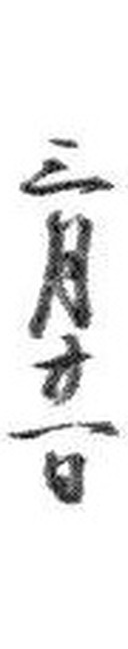三月廿一日

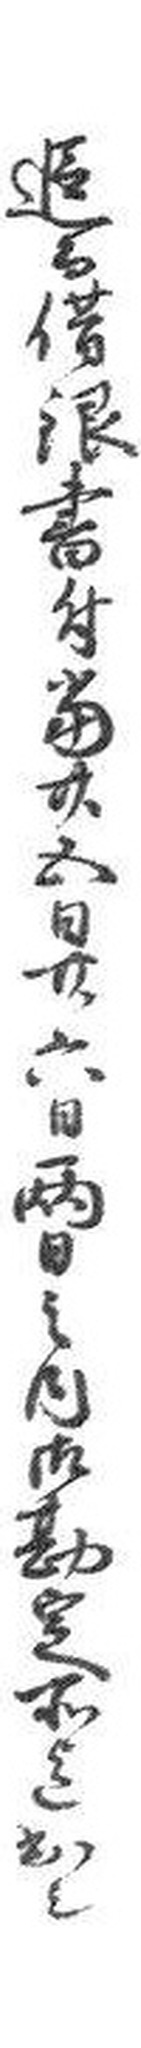追而借銀書付当廿五日廿六日両日之内御勘定所迄出シ
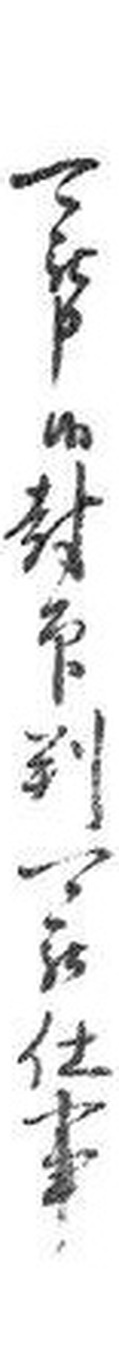可被申候封印判可被仕事
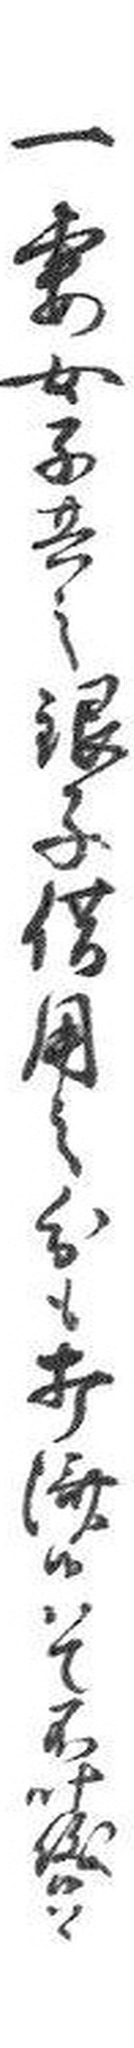一妻女子共之銀子借用之分も相済候はて不叶儀候はゝ
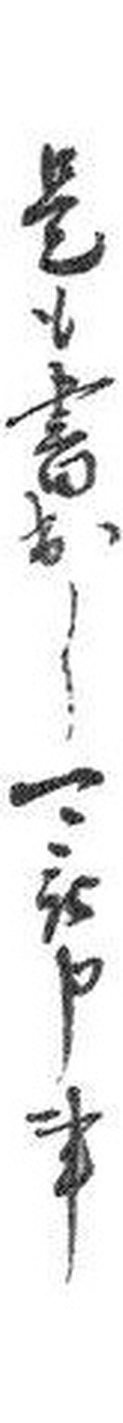是も書出し可被申事
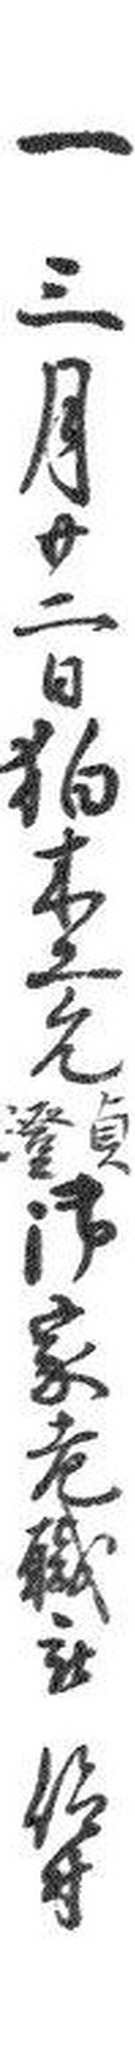一三月廿二日狛杢允貞澄御家老職被仰付
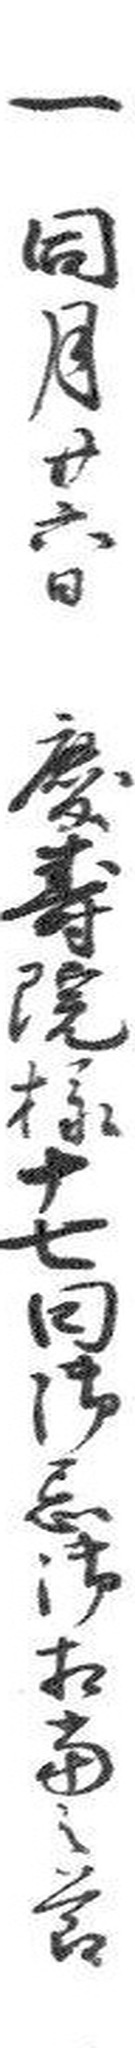一同月廿六日慶寿院様十七回御忌御相当之節
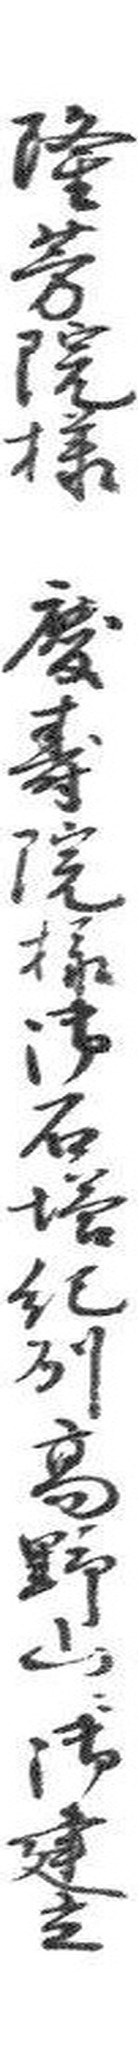隆芳院様慶寿院様御石塔紀州高野山ニ御建立
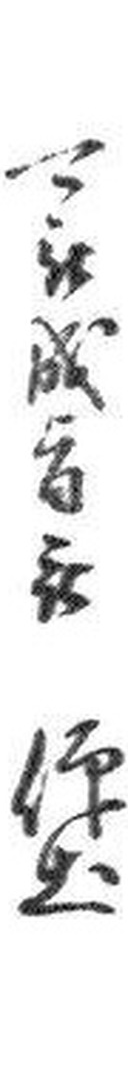可被成旨被仰出
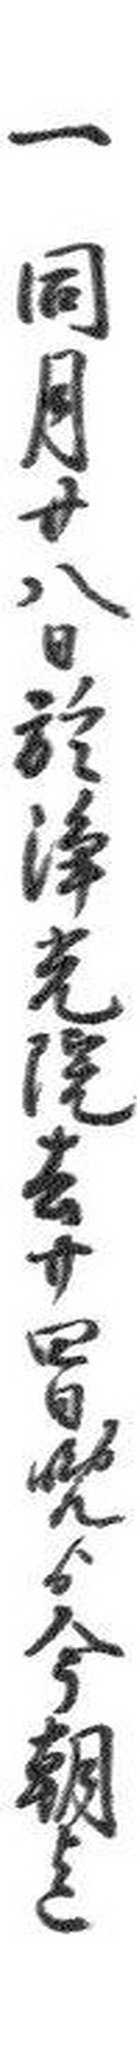一同月廿八日於浄光院去廿四日晩ゟ今朝迄
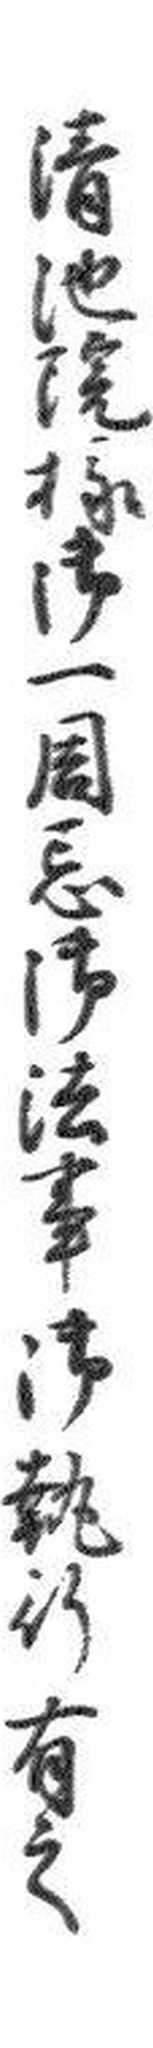清池院様御一周忌御法事御執行有之
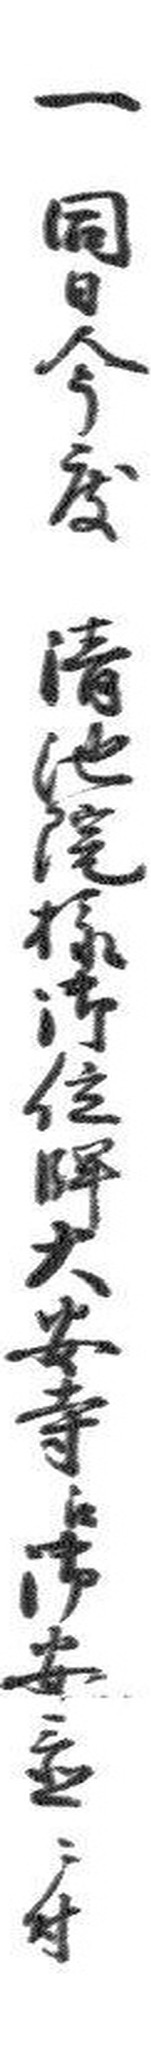一同日今度清池院様御位牌大安寺江御安置ニ付
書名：家譜 八 光通公 従寛文十年到同十二年
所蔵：福井県文書館 Fukui Prefectural Archives
